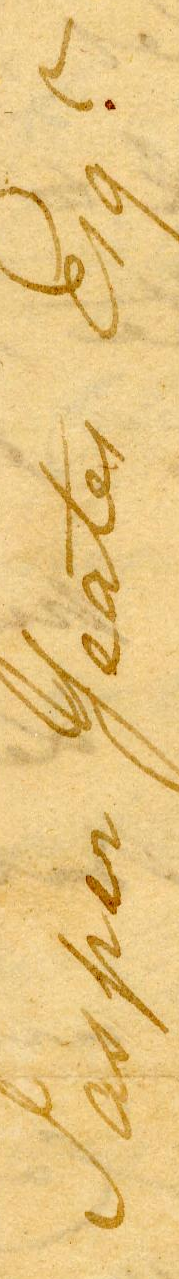Jasper Yeates Esq^r
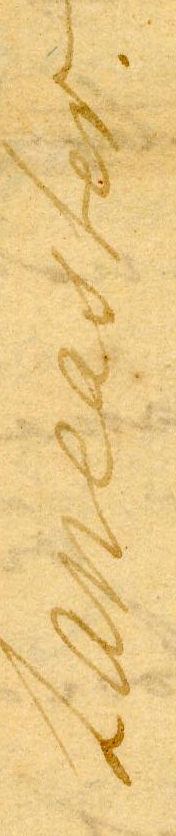Lancaster
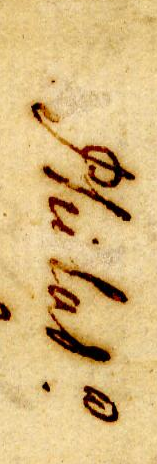Philad^a
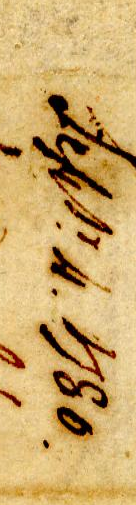Sept^r. 4. 1780
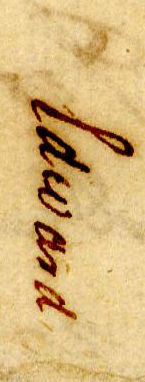Edward
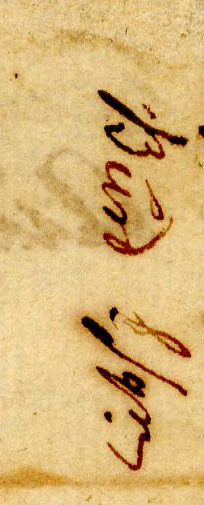Burd Esq^r
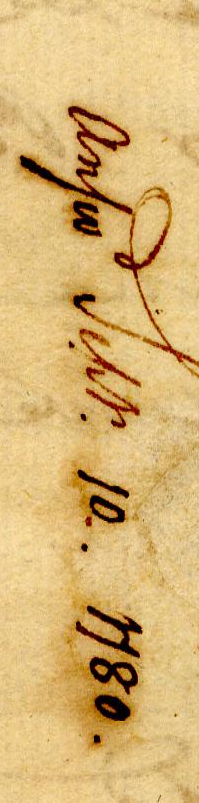Answ^d Sept^r. 10. 1780.
